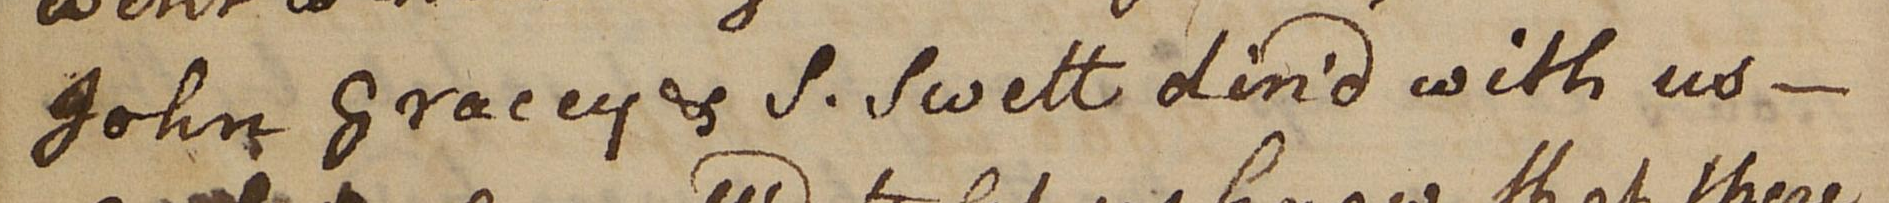John Gracey & S. Swett din'd with us-
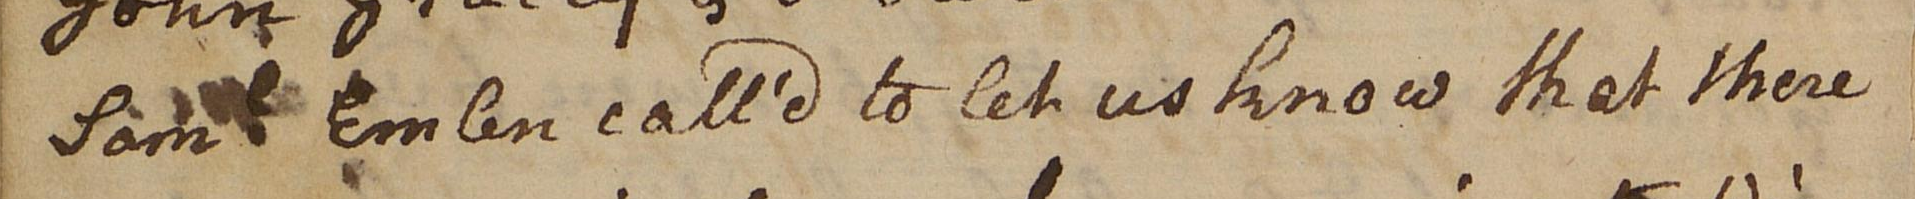Sam^l. Emlen call'd to let us know that there
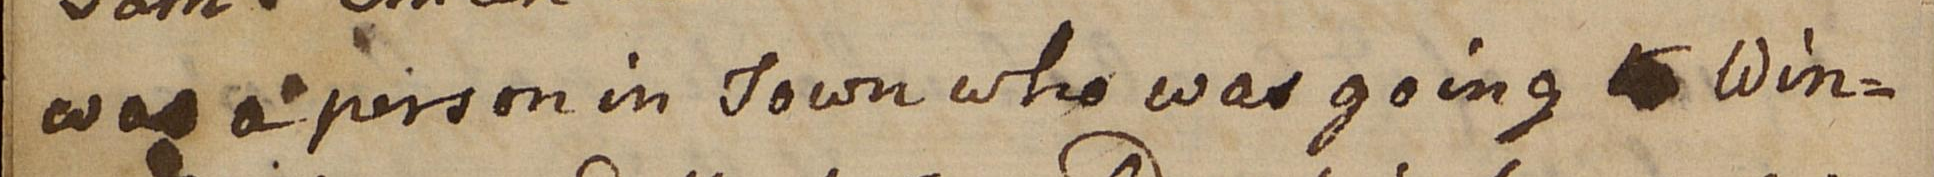was a person in Town who was going to Win-
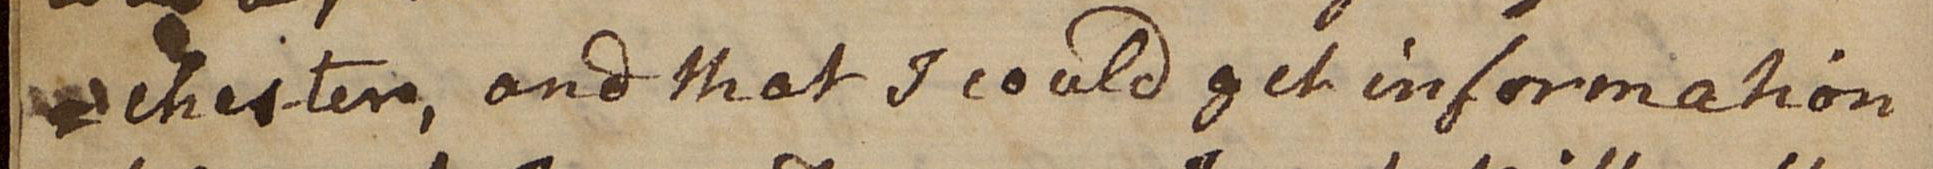-chester, and that I could get information
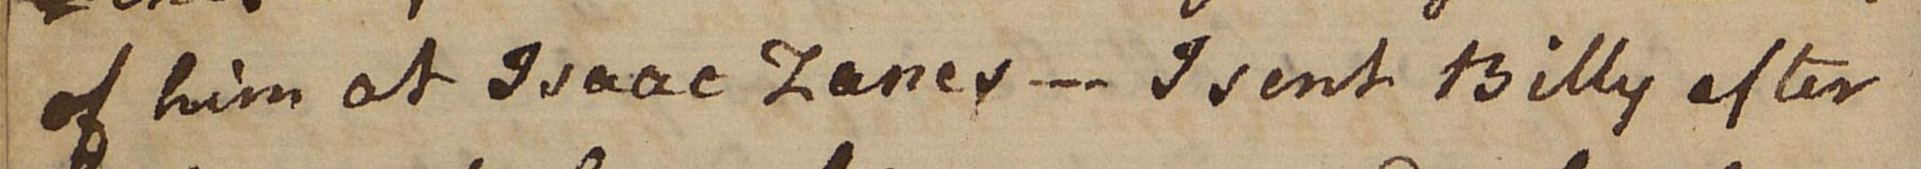of him at Isaac Zanes- I sent Billy after
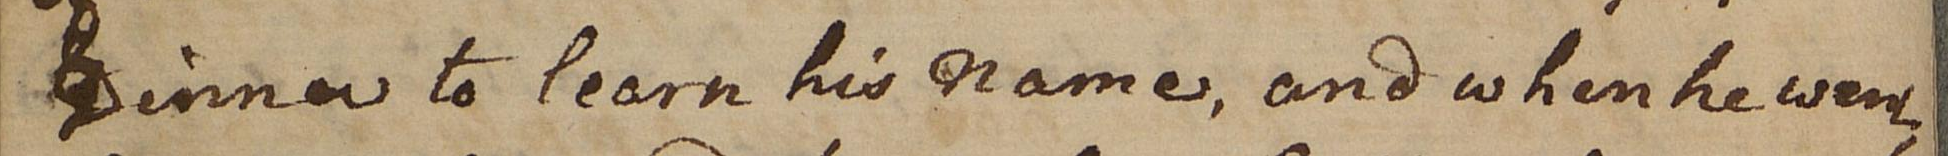Dinner to learn his name, and when he went
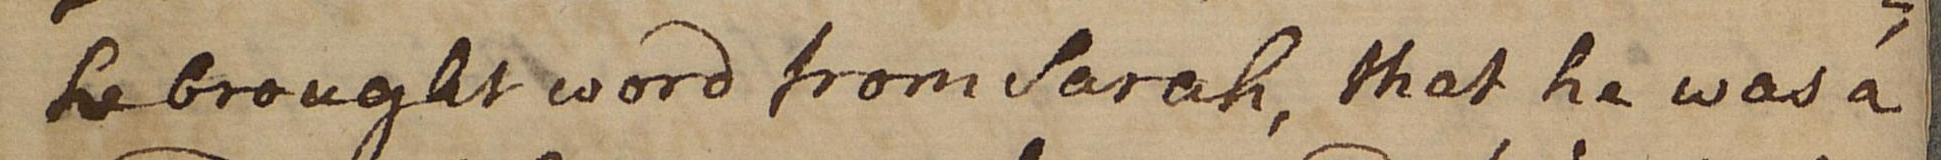he brought word from Sarah, that he was a
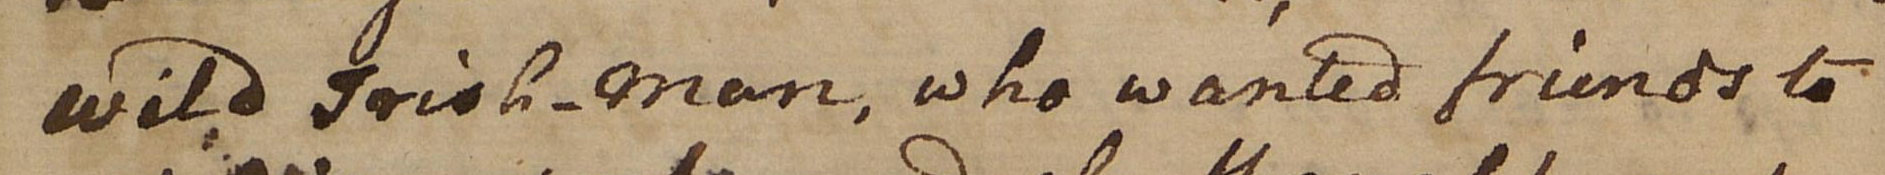wild Irish-man, who wanted friends to
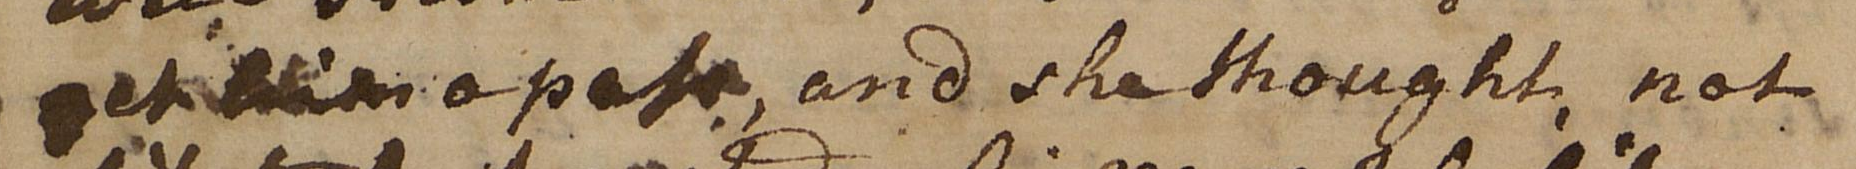get him a pass, and she thought not
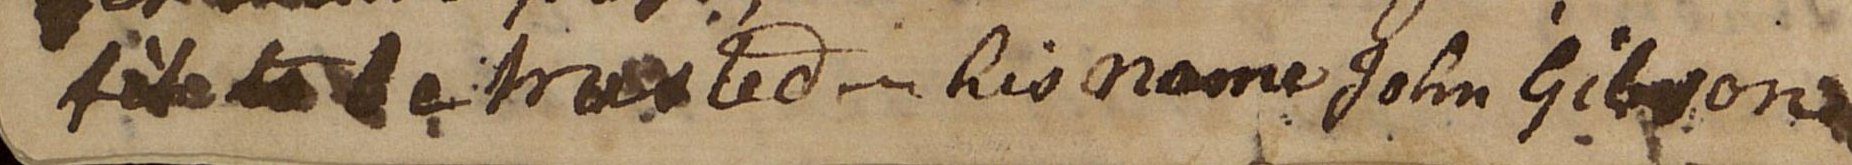fit to be trusted- his name John Gilson
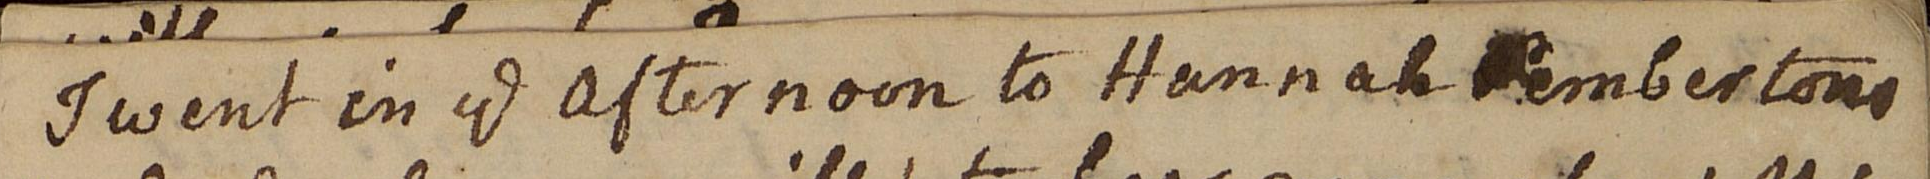I went in y^e afternoon to Hannah Pembertons
